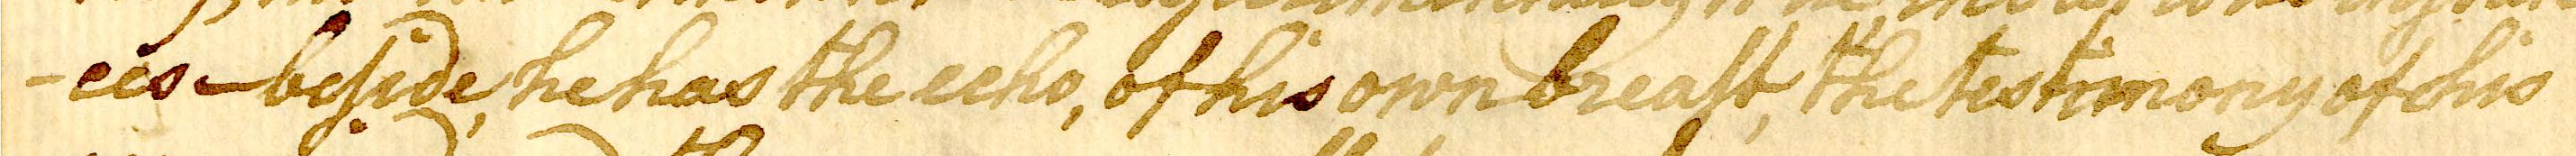-ces- beside, he has the echo, of his own breast, the testimony of his
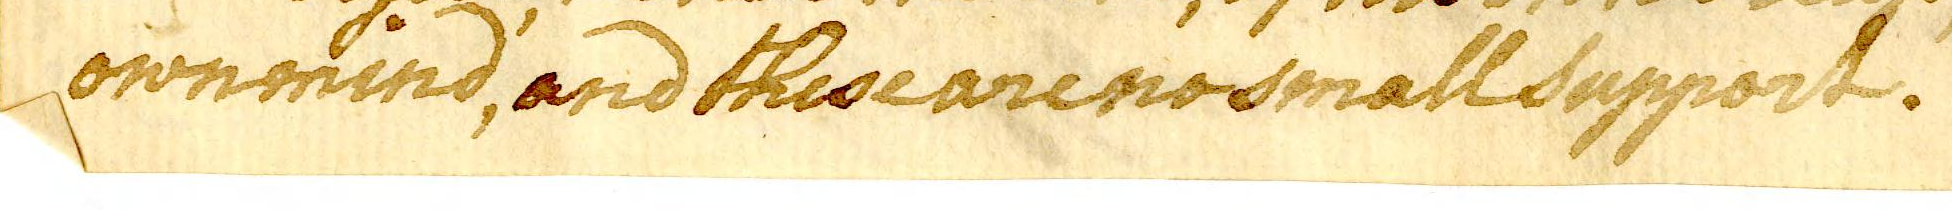own mind, and these are no small support.
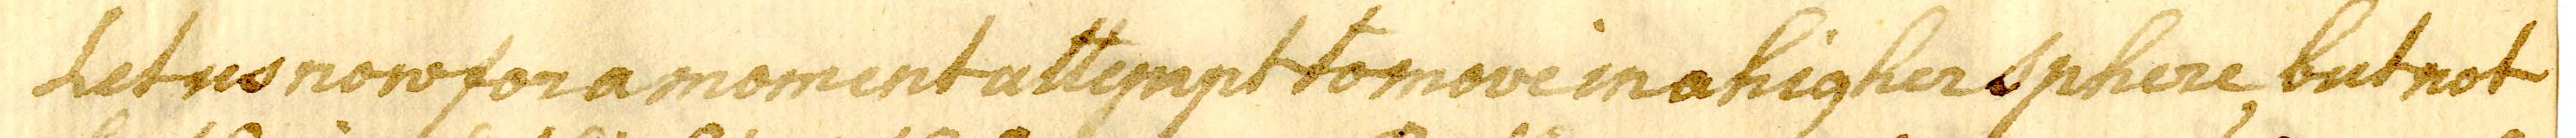Let us now for a moment attempt to move in a higher sphere, but not
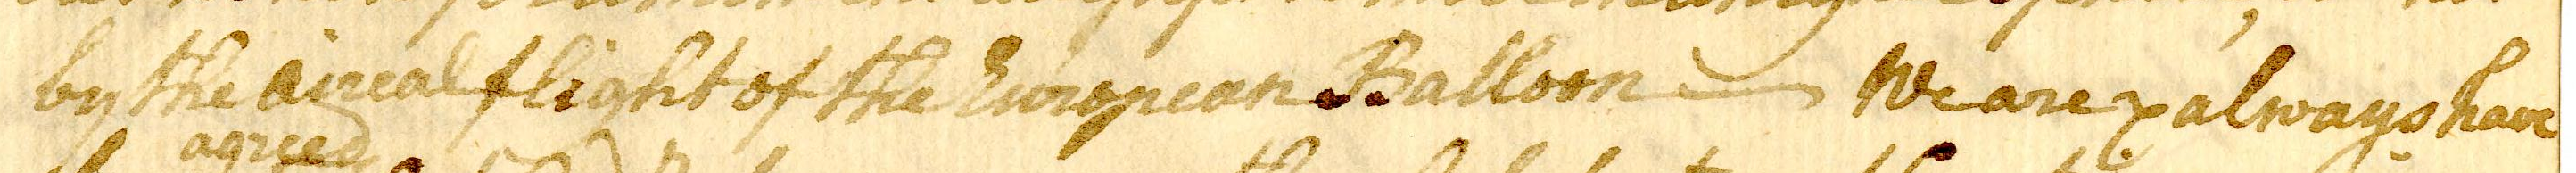by the aireal flight of the European Balloon- We are & always have
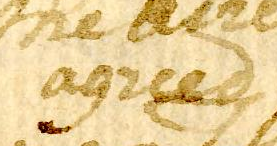agree
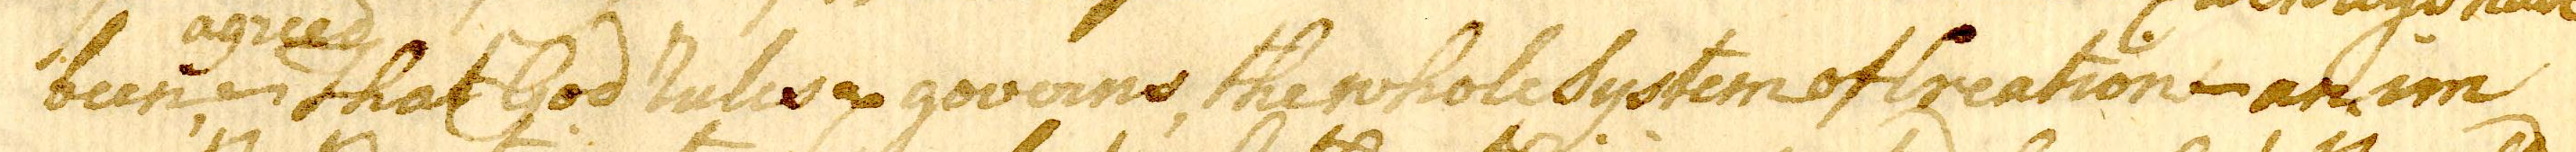been- that God Rules & governs, the whole System of Creation-an im
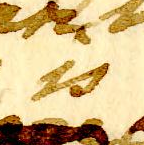is
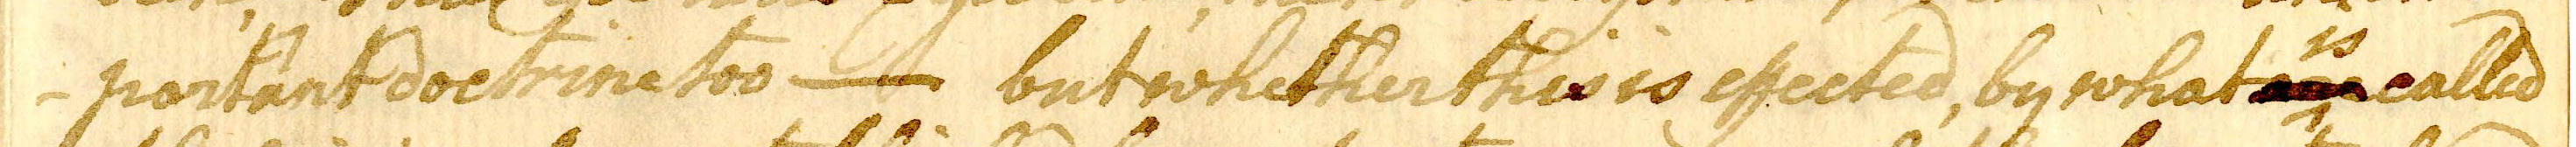-portant doctrine too- but whether this is effected, by what [___] called
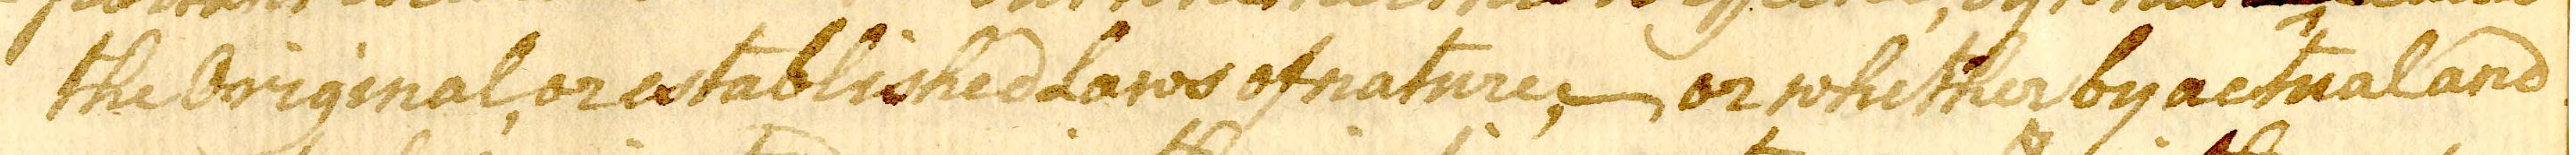the Original, or established Laws of nature,- or whether by actual and
